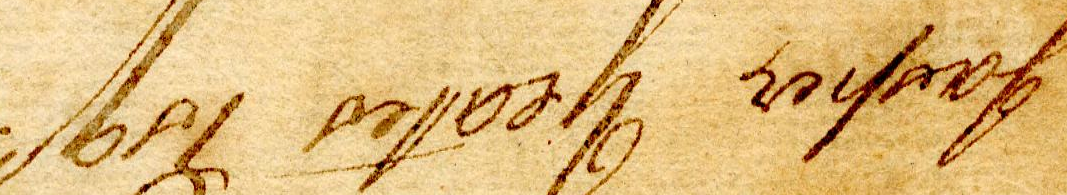Jasper Yeates Esq^r.
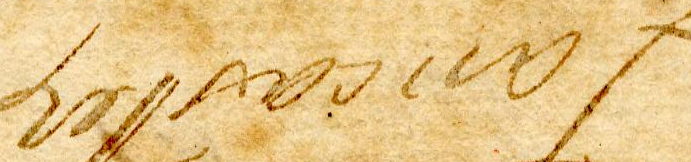Lancaster
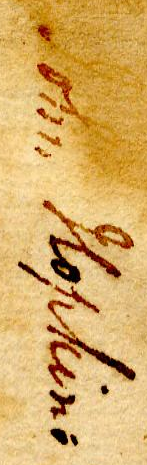John Hopkins
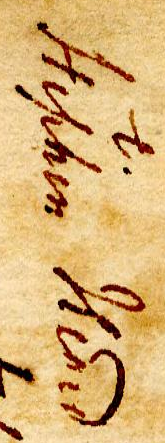Stephen Heard
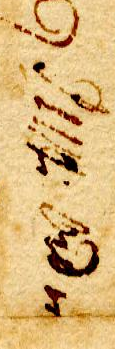Pells Order
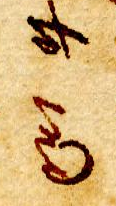to end
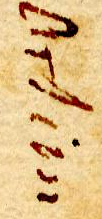Action
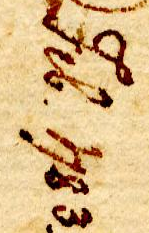Feb. 1783.
